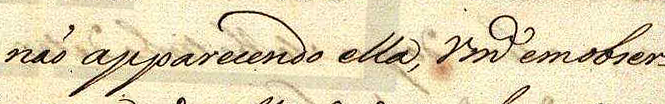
naõ apparecendo ella, v m.e em obser
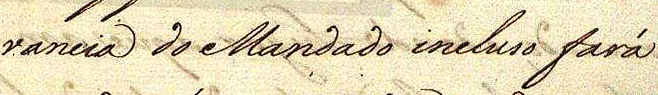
vancia do Mandado incluso fará
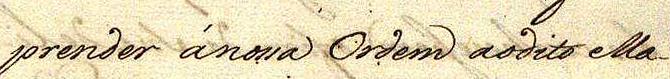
prender á nossa Ordem ao dito Ma
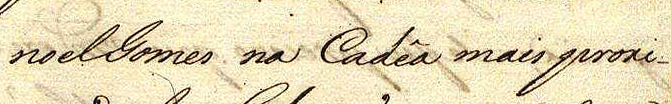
noel Gomes na Cadêa mais proxi
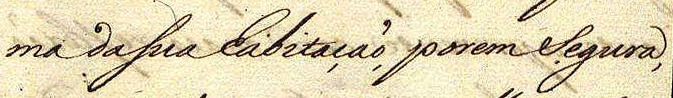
ma da sua habitaçaõ, porem Segura,
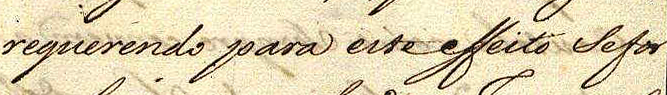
requerendo para este effeito se for
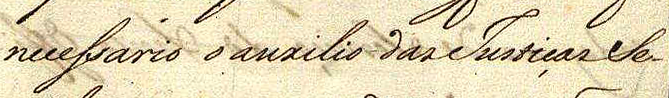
necessario o auxilio das Iustiças Se
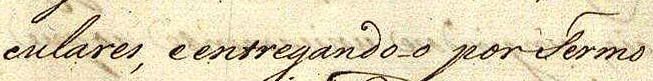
culares, e entregando-o por Termo
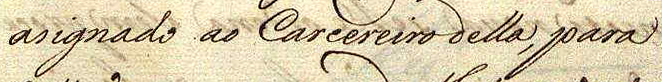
asignado ao Carcereiro della, para
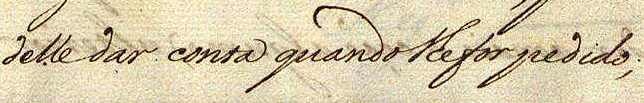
delle dar conta quando lhe for pedido;
